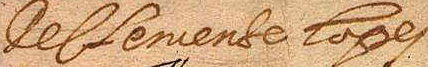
de Clemente Lopes
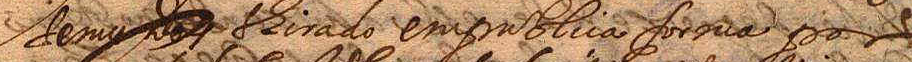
temunhas thirado em publiça forma por
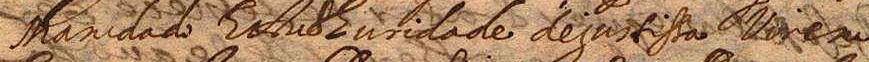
Mamdado E Authuridade de justissa Virem
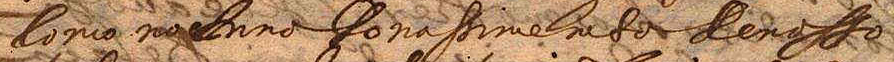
Como no Anno Do nassimemto de nosso
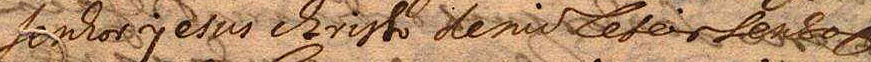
Senhor yesus christo de mil e seissentos
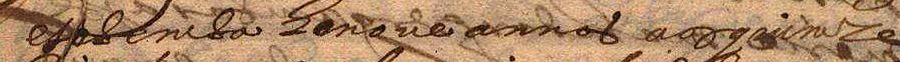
e sesemta he noue annos aos quimze
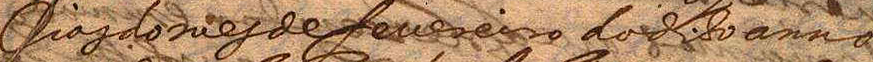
dias do mes de feuereiro do dito anno
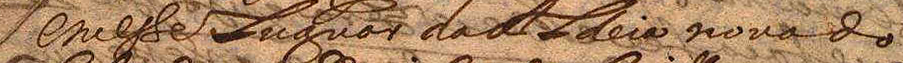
em esse Luguar da ALdeia noua do
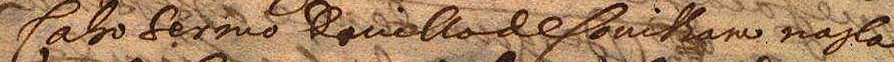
Cabo termo da uilla de Couilham nas ca
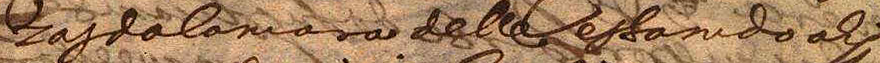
zas da Camara della estamdo ahj
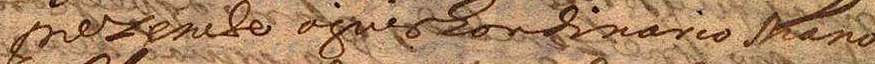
prezemte o juis hordinario Mano
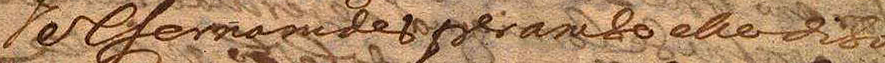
el Fernamdes peramte elle dito
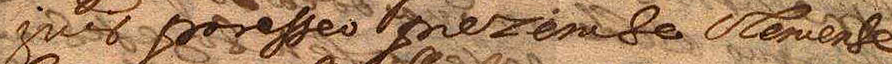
juis paresseo prezemte clemente
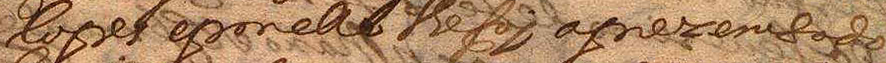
lopes e por elle lhe foj aprezemtado
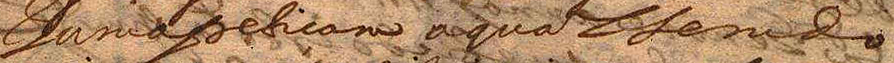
huma petiçam a qual semdo
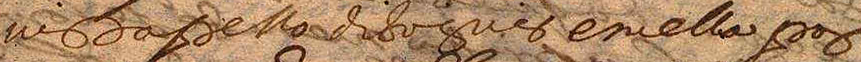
uista pello dito juis em ella pos
